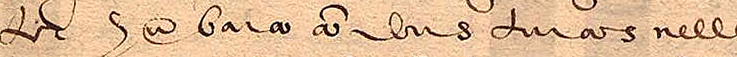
ter hū barco cō dous turcos nelle
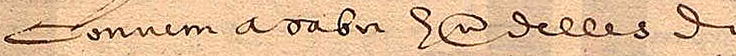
Conuem a saber hū delles di
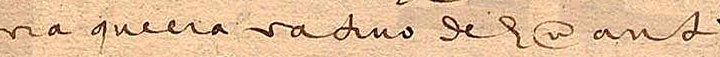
sera que era catiuo de hū anto
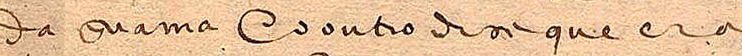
da guama e o outro dise que era
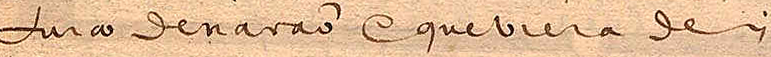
turco de naçaõ e que viera de y
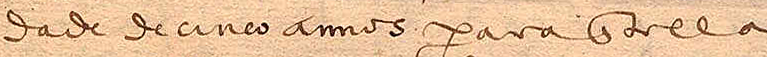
dade de cinco annos ꝑa castella
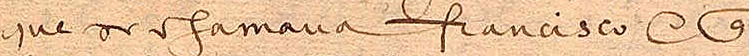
que se chamaua francisco e q̄
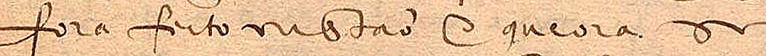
fora feito cristaõ e que ora se
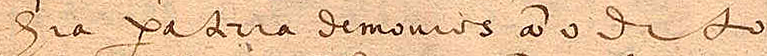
hia ꝑa terra de mouros cō o dito
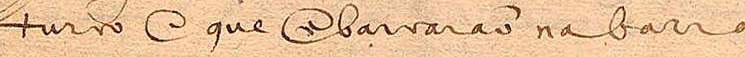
turco e que ēbarcaraõ na barra
